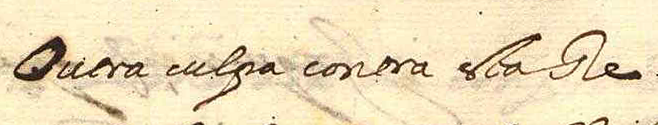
Outra culpa contra esta Re
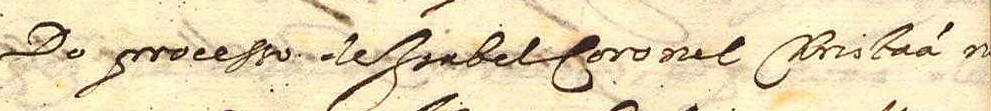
Do processo de Jsabel Coronel Christaã n
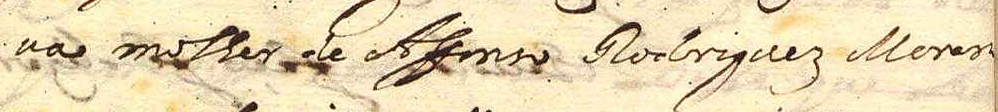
ua molher de Affonso Rodriguez Moren
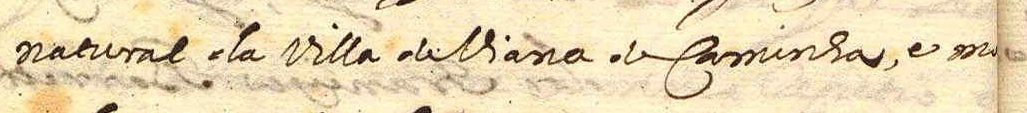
natural da villa de Viana de Caminha, e mo
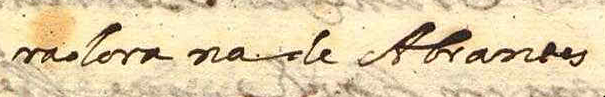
radora na de Abrantes
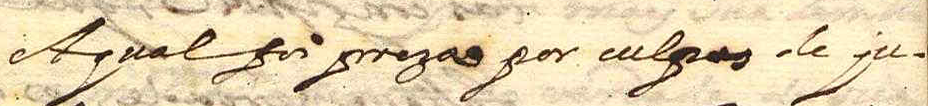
A qual foi preza por culpas de ju
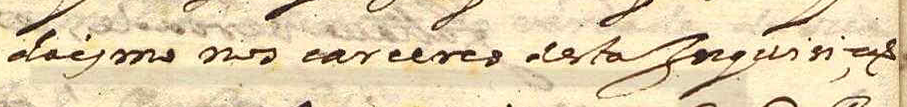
daismo nos carceres desta Jnquisiçaõ
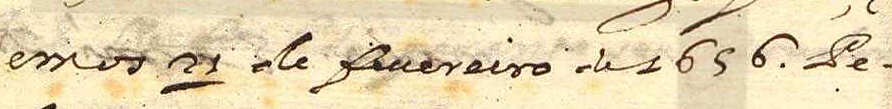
em os 21 de feuereiro de 1656. Pe
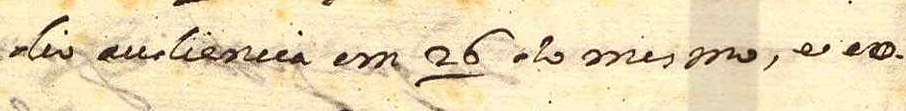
dio audiencia em 26 do mesmo, e co
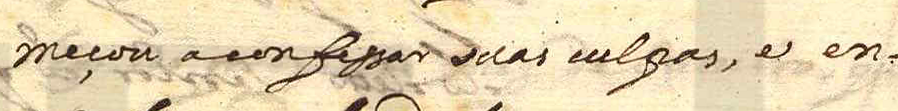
meçou a confessar suas culpas, e en
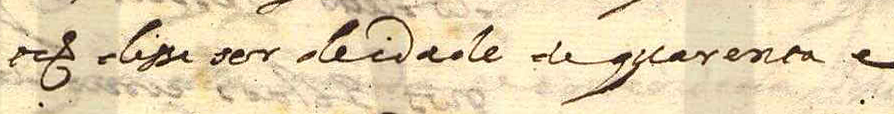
taõ disse ser de idade de quarenta e
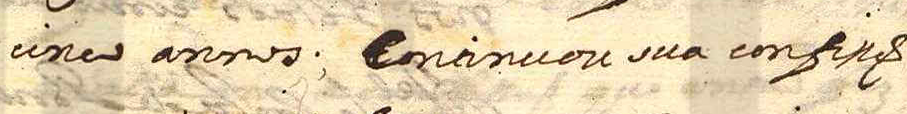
cinco annos; continuou sua confissaõ
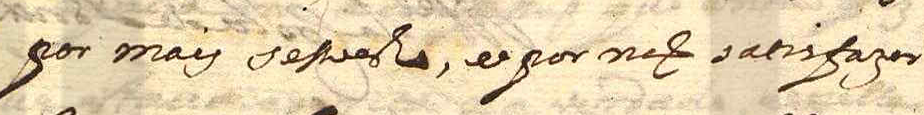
por mais sessoẽs, e por naõ satisfazer
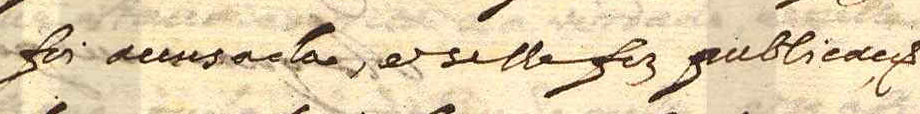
foi accusada, e se lhe fez publicaçaõ
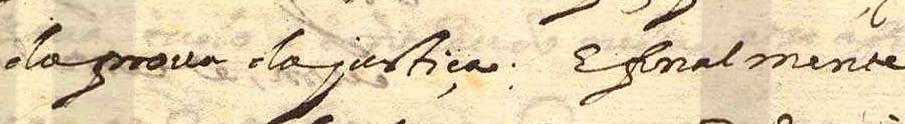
da proua da justiça. E finalmente
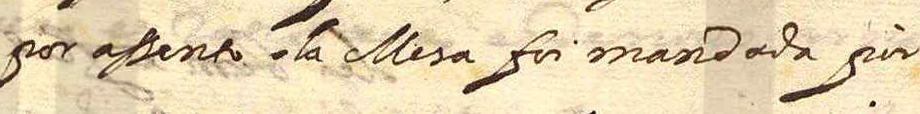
por assento da Mesa foi mandada pir
